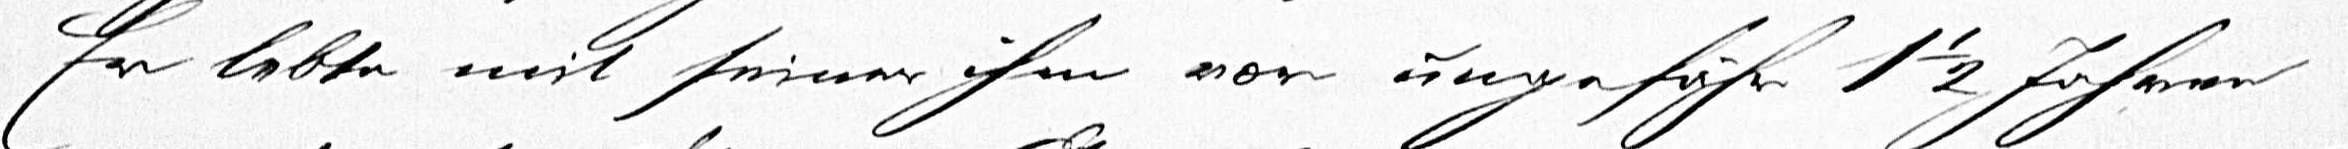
Es lebte mit seiner ihm vor ungefähr 1 1/2 Jahre
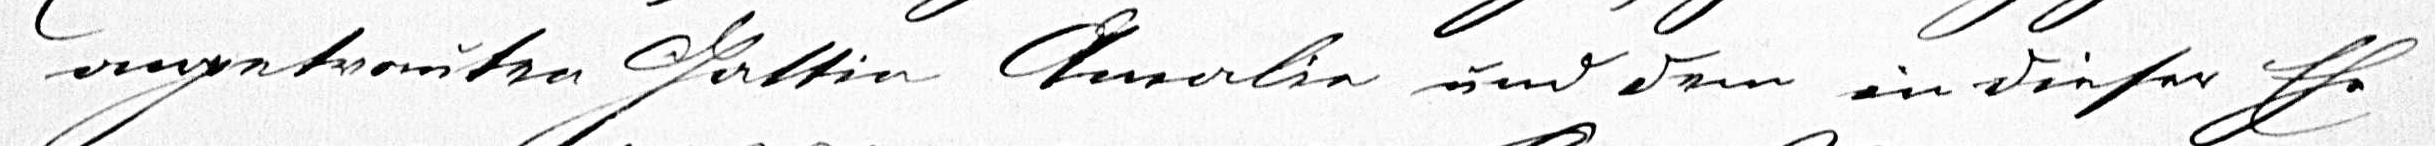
angetrauten Gattin Amalie und dem in dieser Ehe
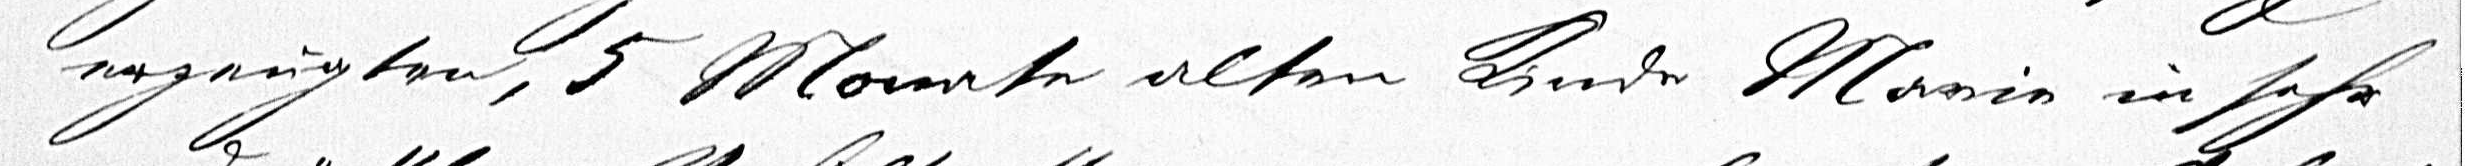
erzeugten, 5 Monate alten Kinde Marie in sehr
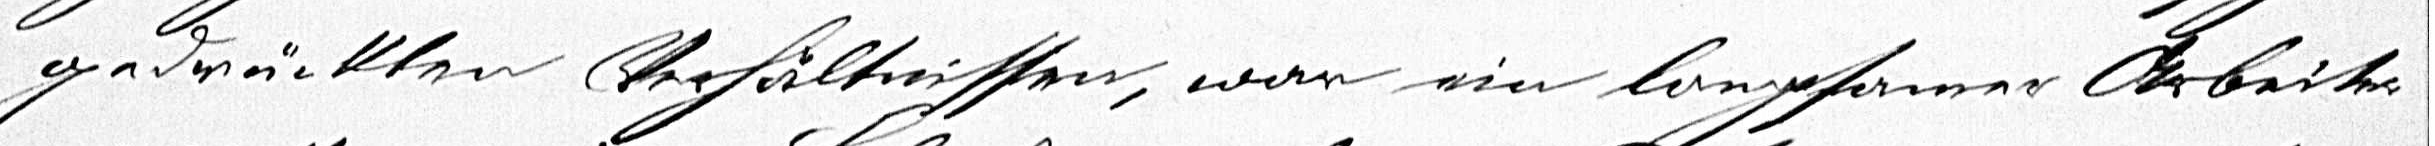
gedrückten Verhältnissen, war ein langsamer Arbeiter
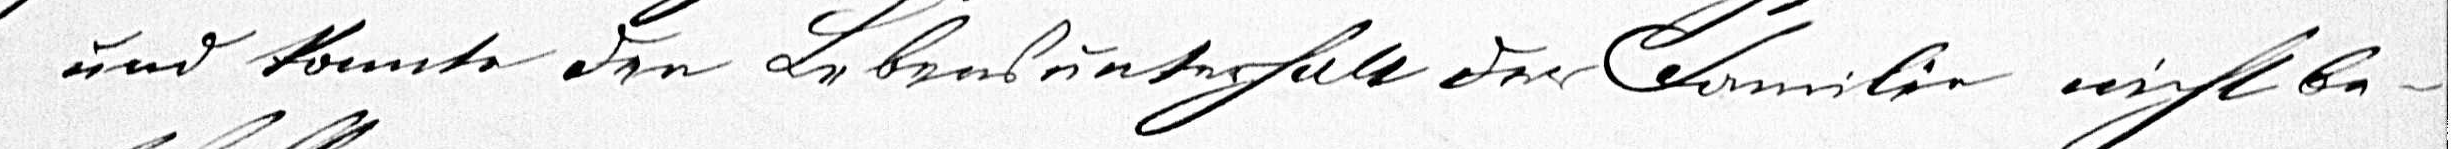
und konnte den Lebensunterhalt der Familie nicht be¬
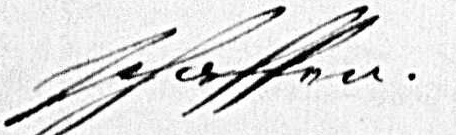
schaffen.
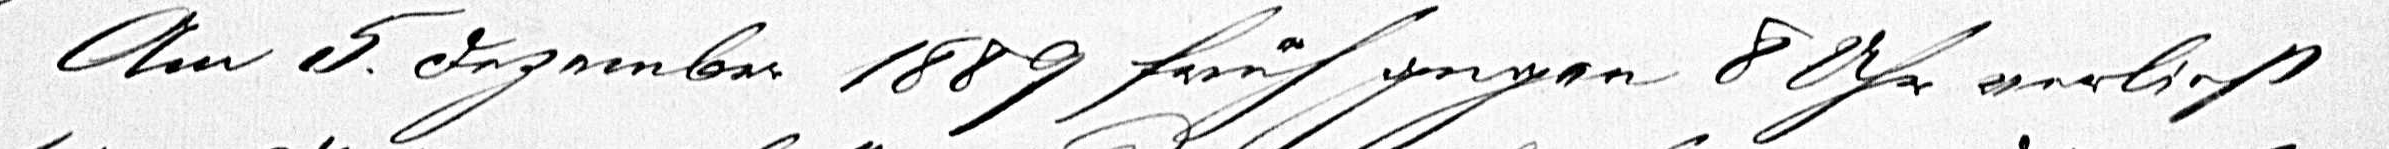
Am 5. Dezember 1889 früh gegen 8 Uhr verließ
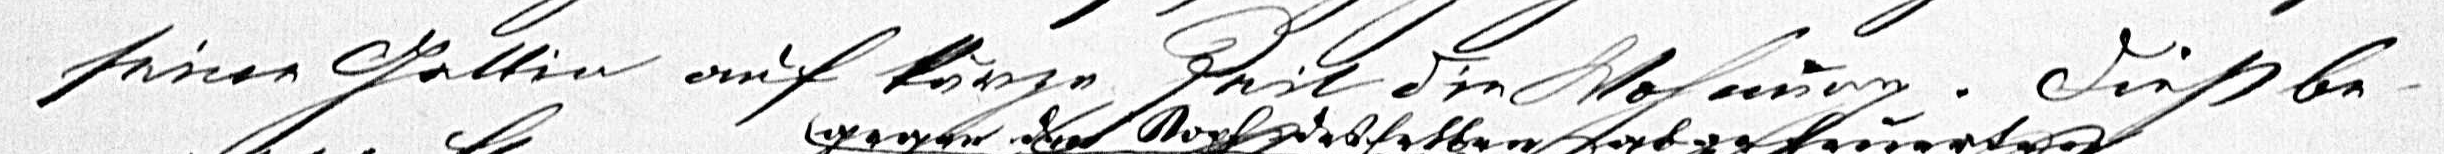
seine Gattin auf kurze Zeit die Wohnung. Dieß be¬
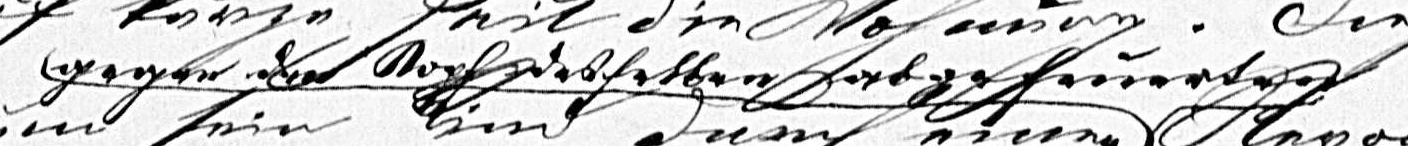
gegen xx desselben abgefeuerter
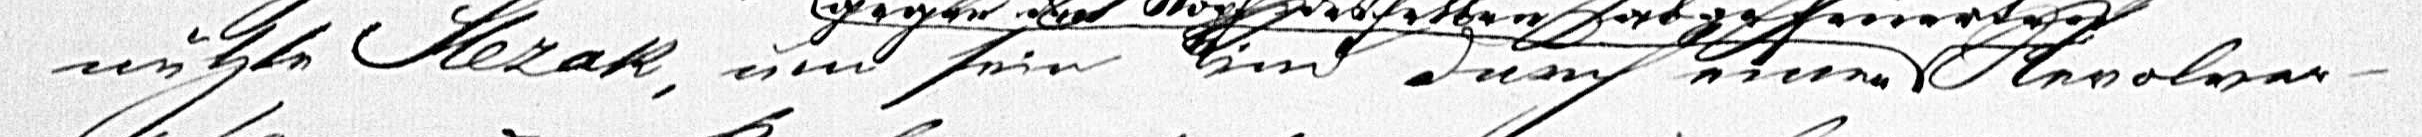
nutzte Slezak, um sein Kind durch einer Revolver¬
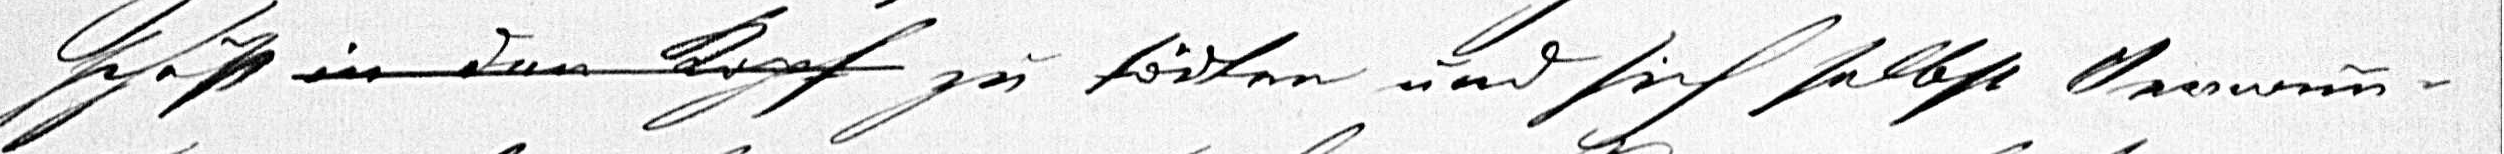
schuß zu tödten und sich selbst Verwun¬
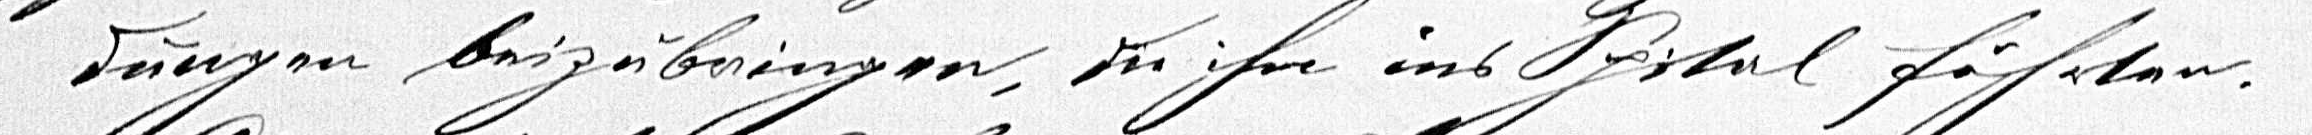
dungen beizubringen, die ihn ins Spital führten.
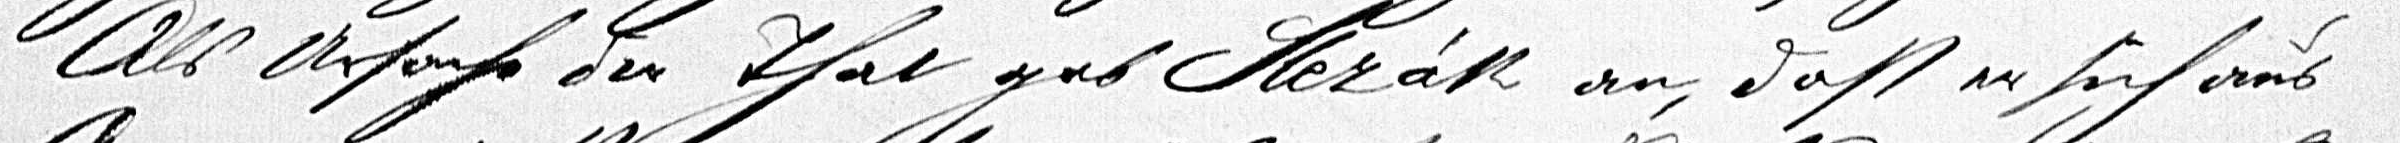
Als Ursache der That gab Slezák an, daß er sich aus
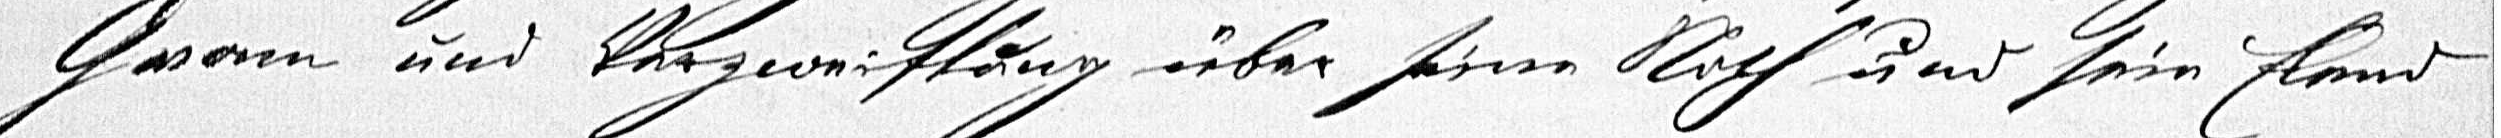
Gram und Verzweiflung über seine Noth und sein Elend
